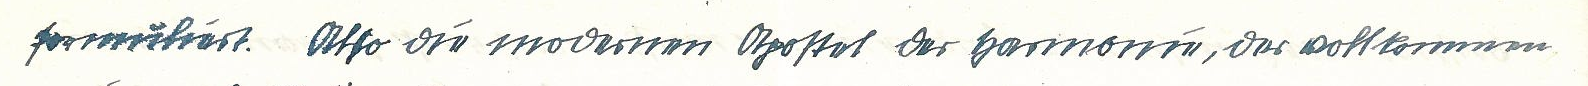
formuliert. Also die modernen Apostel der Harmonie der vollkommenen
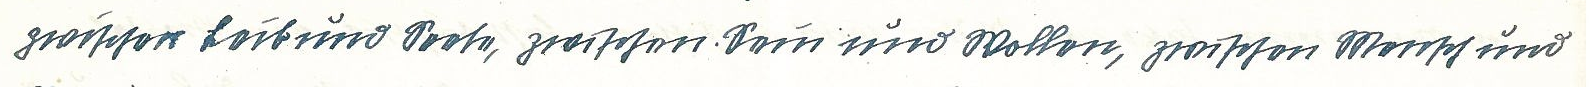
zwischen Leib und Seele, zwischen Sein und Wollen, zwischen Mensch und
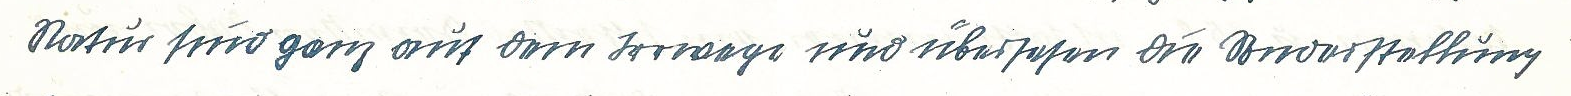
Natur sind ganz auf dem Irrwege und übersehen die Sonderstellung
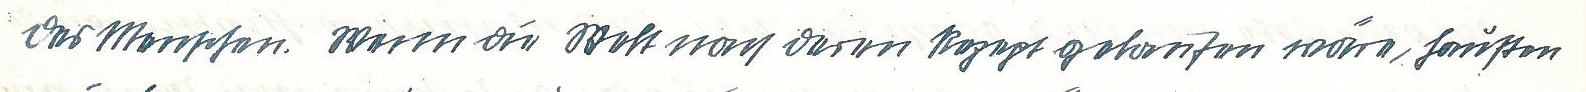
des Menschen. Wenn die Welt nach dem Rezept gelaufen wäre, hausten
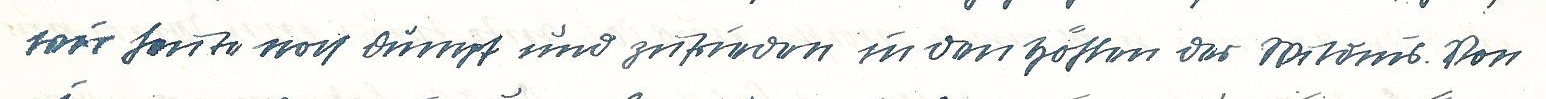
wir heute noch dumpf und zufrieden in den Höhlen der Wildnis. Von
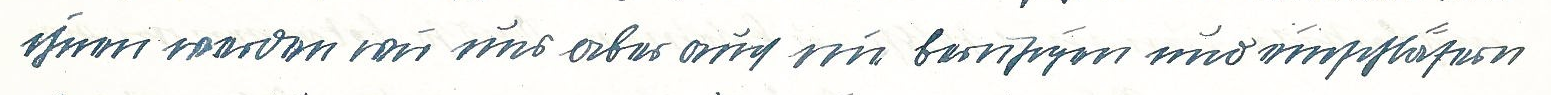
ihnen werden wir uns aber auch nie beruhigen und einschläfern
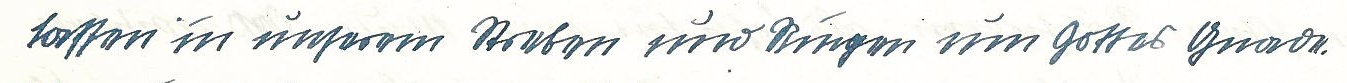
lassen in unserem Streben und Ringen um Gottes Gnade.
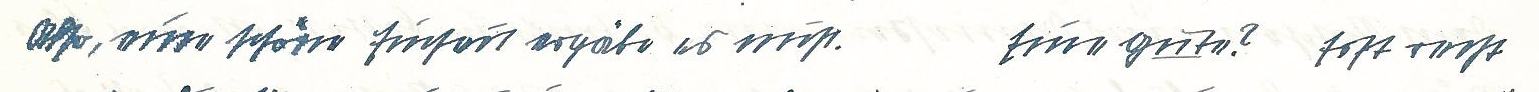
Also, eine schöne Einheit ergäbe das nicht. Eine gute? Erst recht
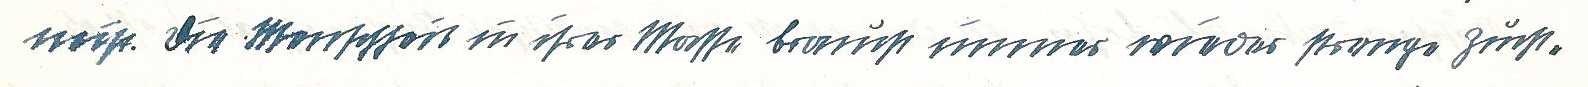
nicht. Die Menschheit in ihrer Masse braucht immer wieder strenge Zucht¬
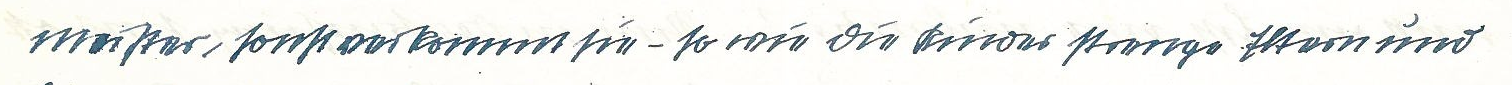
meister, sonst verkommt sie – so wie die Kinder strenge Eltern und
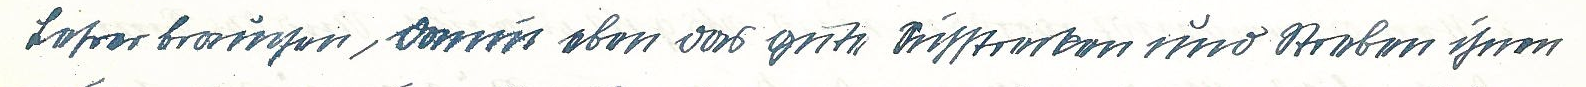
Lehrer brauchen, damit eben das gute Sichstrecken und Streben ihnen
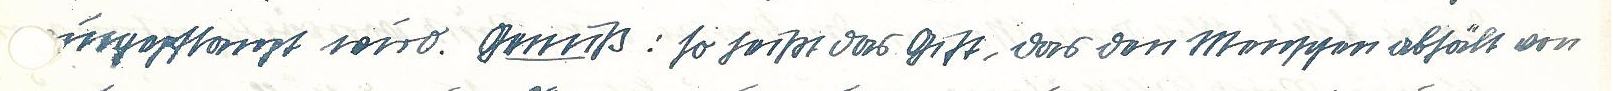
eingepflanzt wird. Genuß: so heißt das Gift, das den Menschen abhält von
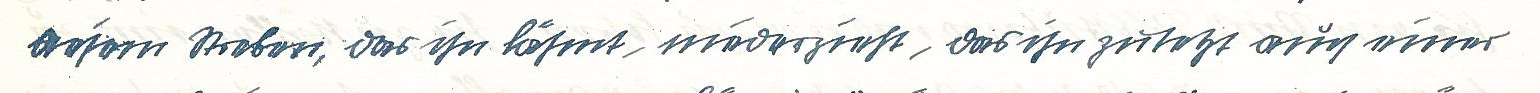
diesem Streben, das ihn lähmt, niederzieht, das ihn zuletzt auch einer
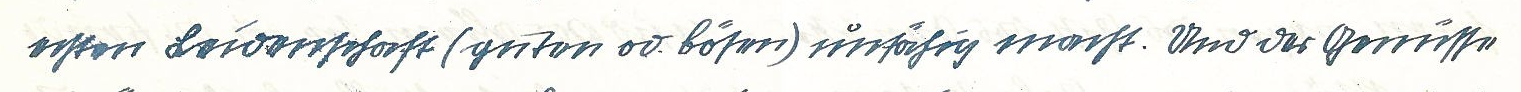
echten Leidenschaft (guten od. bösen) unfähig macht. Und der Genüsse
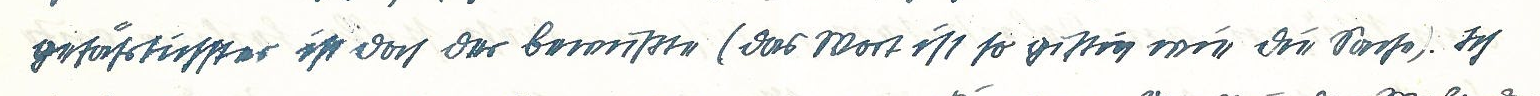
gefährlichster ist doch der bewußte (das Wort ist so giftig wie die Sache). Ich
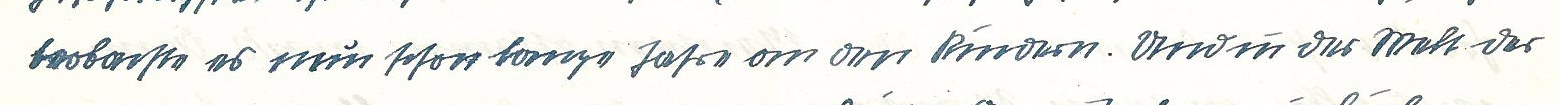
beobachte es nun schon lange Jahre an den Kindern. Und in der Welt der
